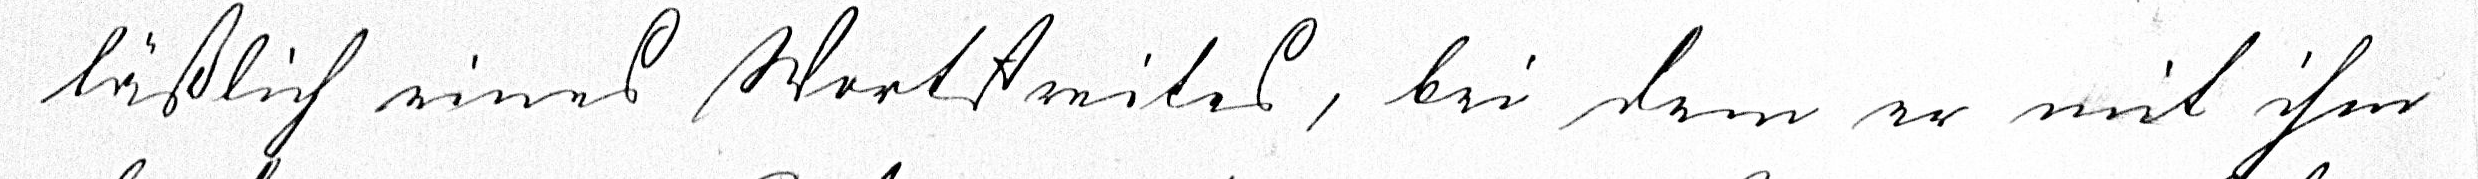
läßlich eines Wertstreites, bei dem er mit ihm
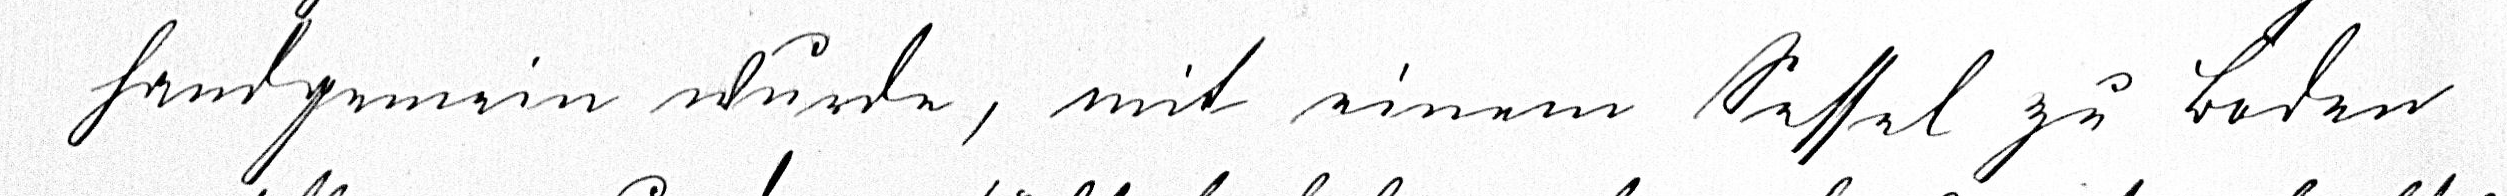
handgemein wurde, mit einem Sessel zu Boden
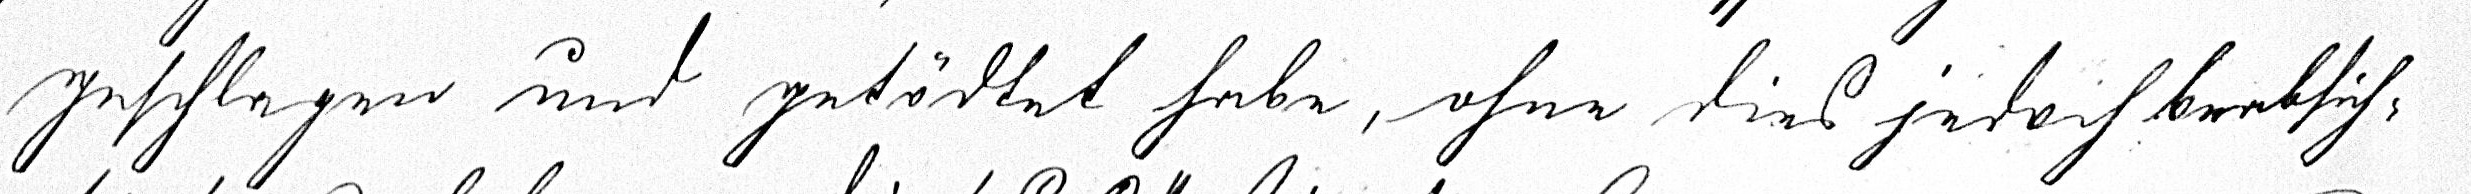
geschlagen und getödtet habe, ohne dies jedoch beabsich¬
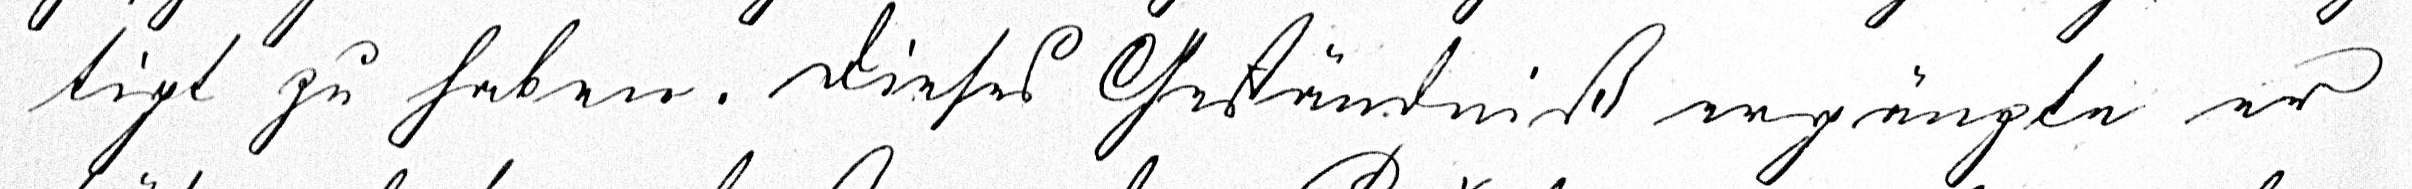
tigt zu haben. Dieses Geständniß ergänzte er
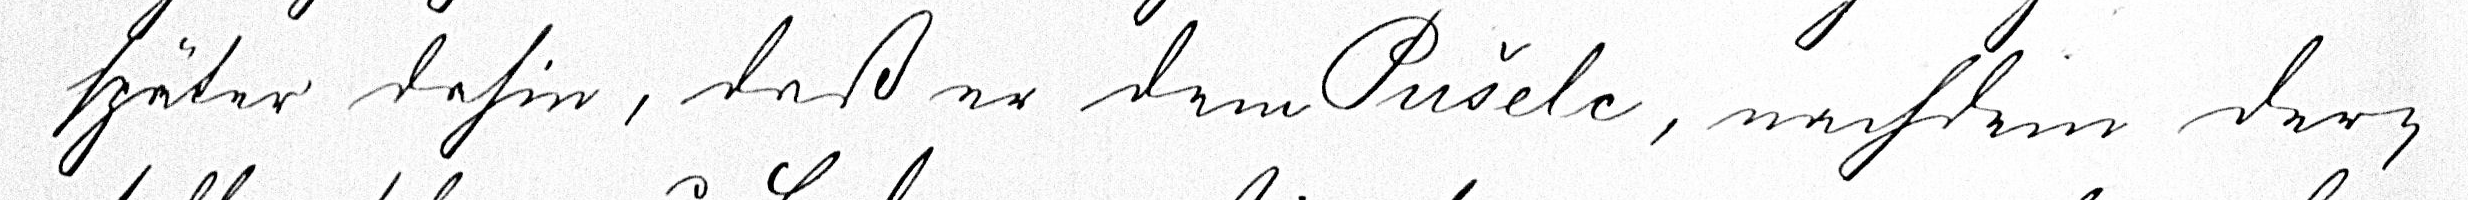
später dahin, daß er dem Pušelc, nachdem der¬
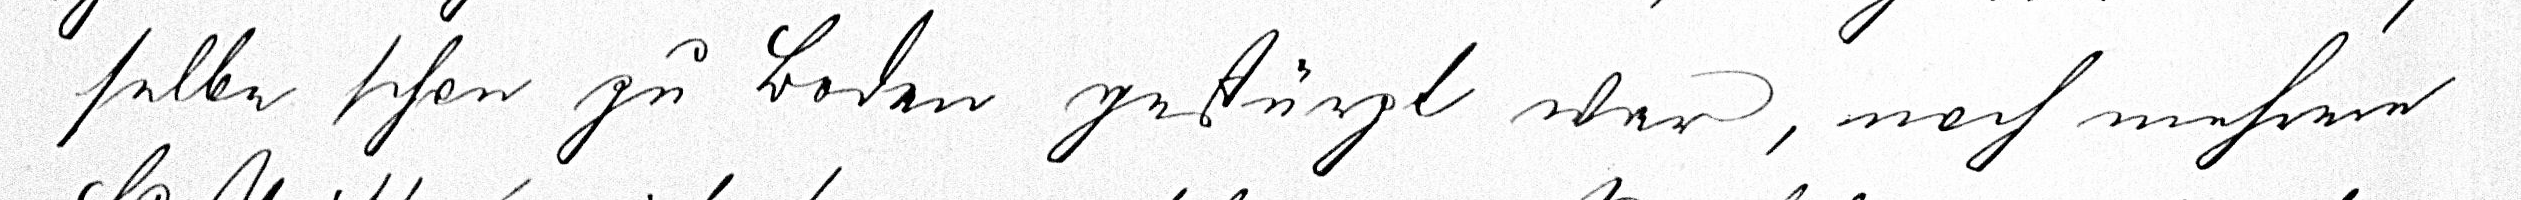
selbe schon zu Boden gestürzt war, noch mehrere
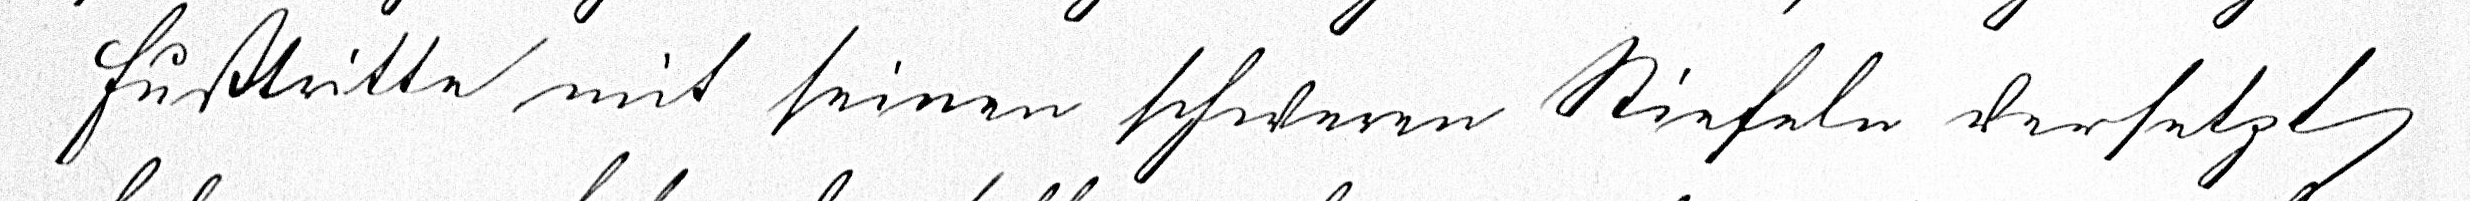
Fußtritte mit seinen schweren Stiefeln versetzt
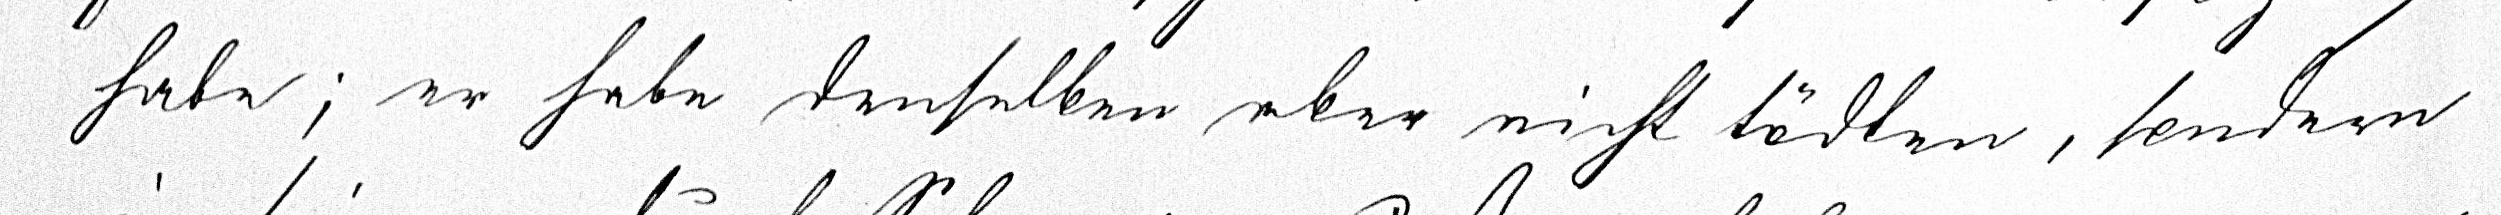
habe; er habe denselben aber nicht tödten, sondern
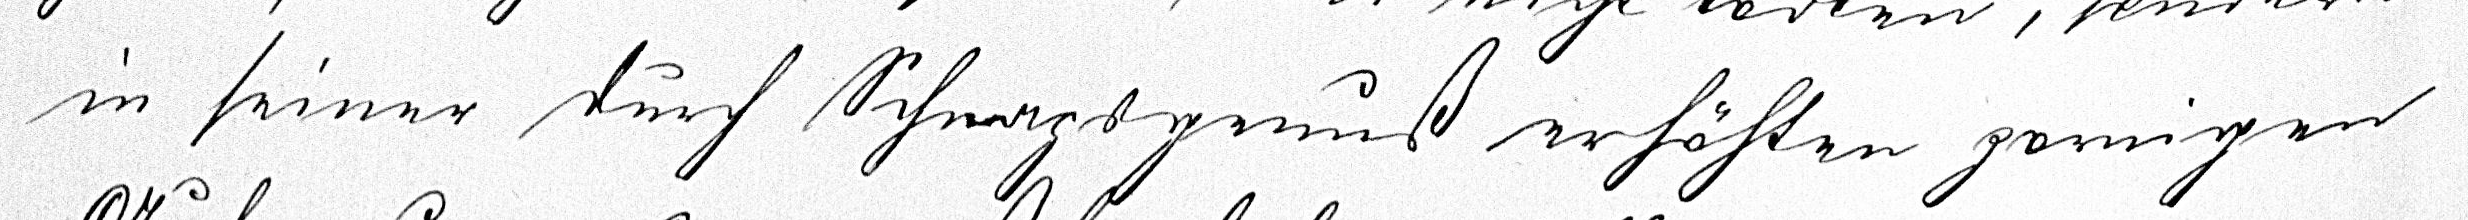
in seiner durch Schwazsgrunß erhöhten zornigen
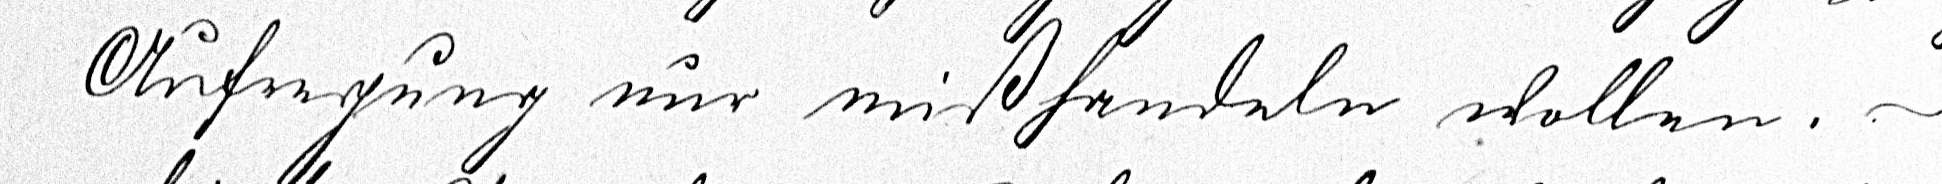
Aufregung nur mißhandeln wollen.
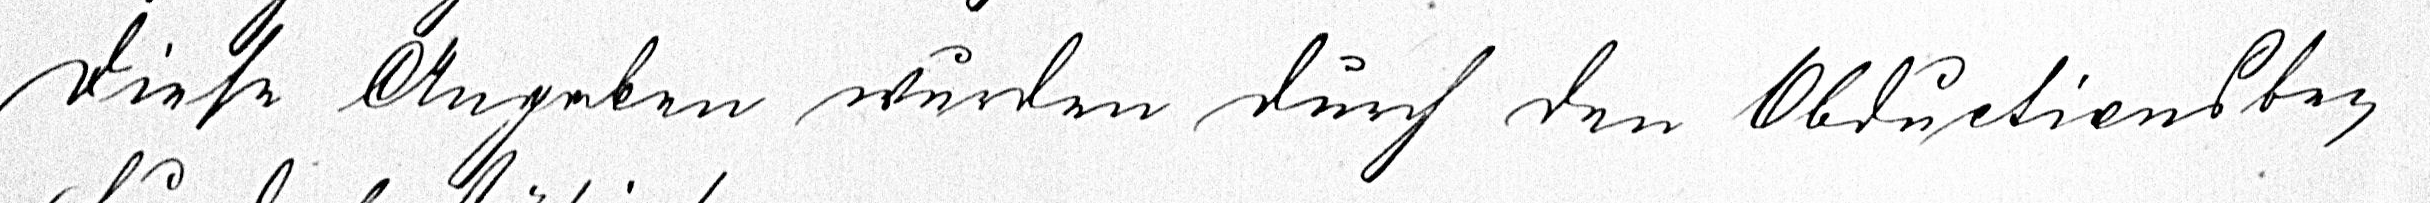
Diese Angeben wurden durch den Obductionsbe¬
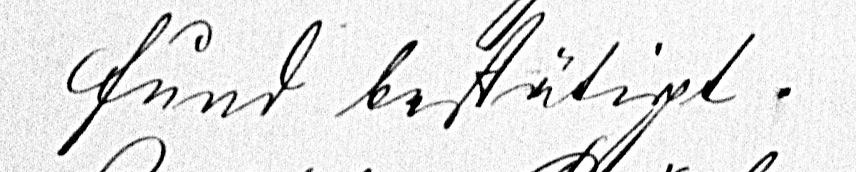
fund bestätigt.
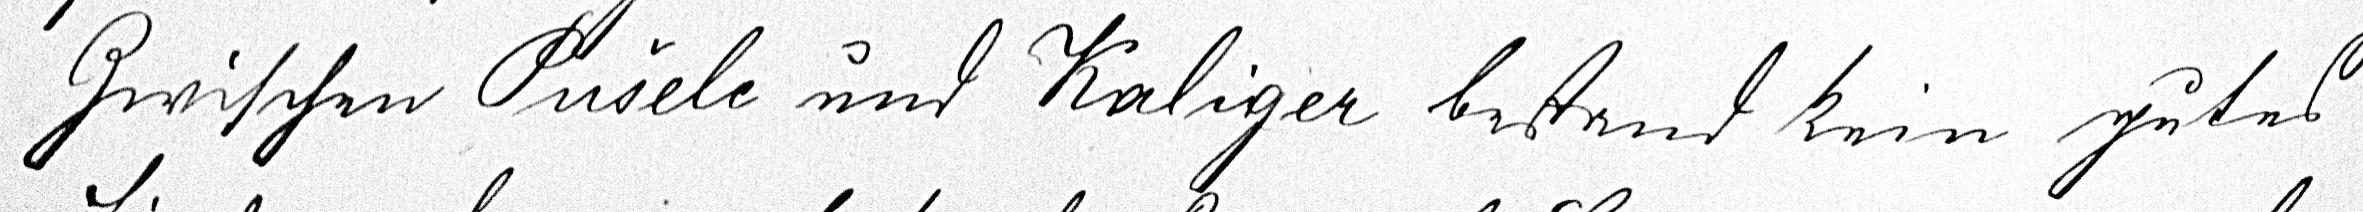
Zwischen Pušelc und Kaliger bestand kein gutes
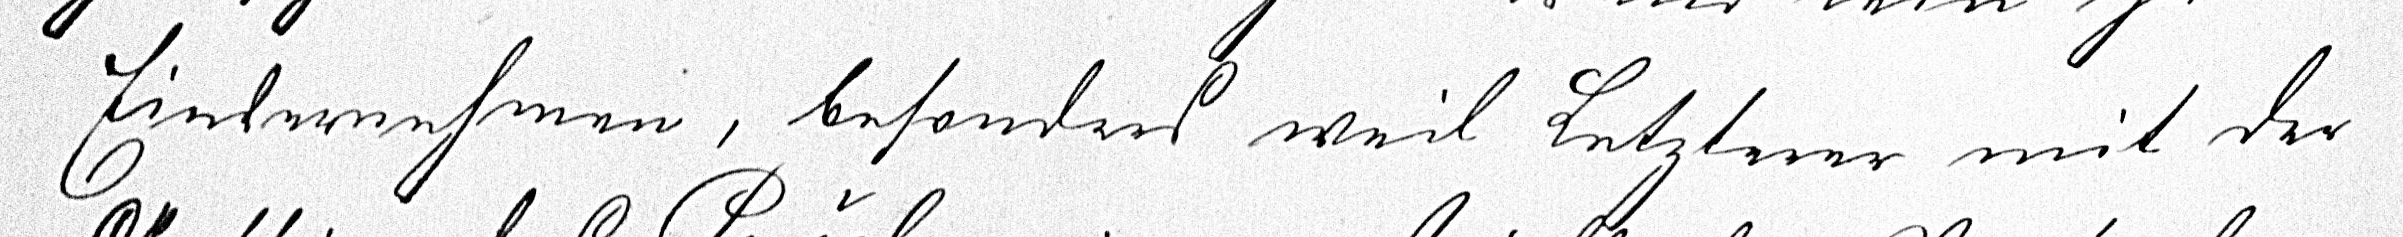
Einvernehmen, besonders weil Letzterer mit der
